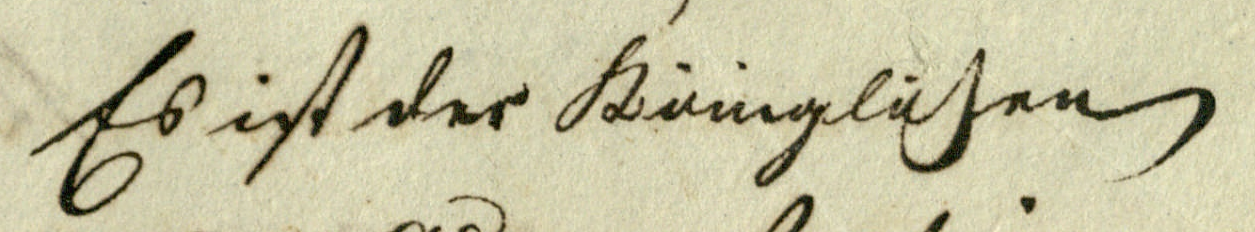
Es ist der Königlichen
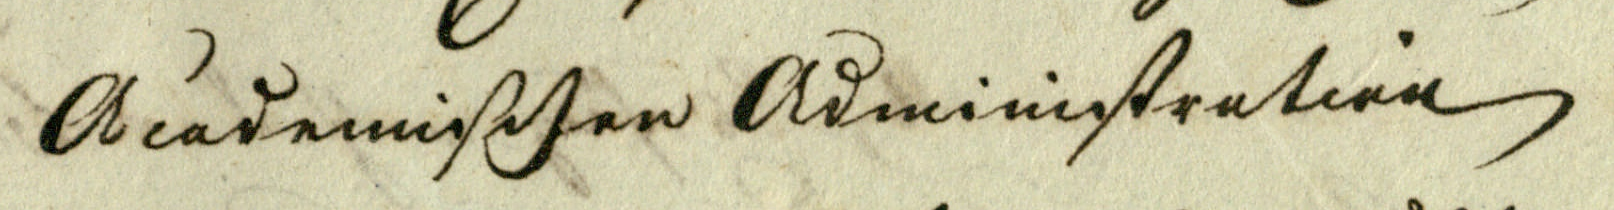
Academischen Administration
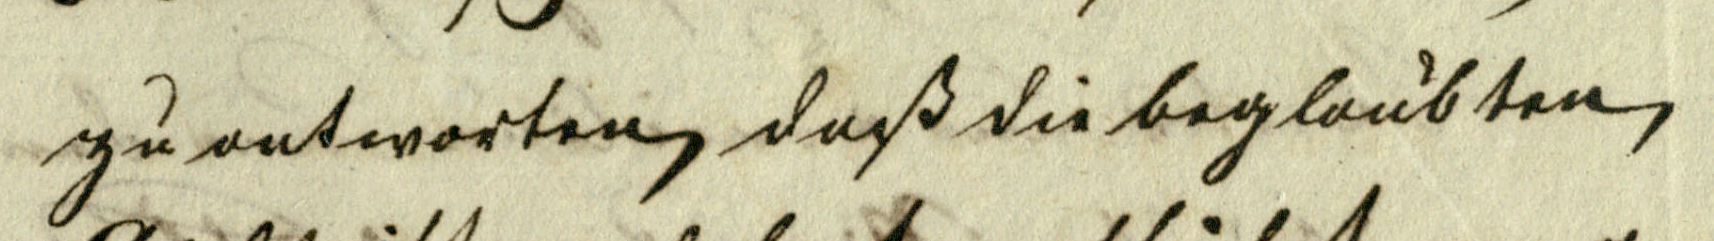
zu antworten, daß die beglaubten
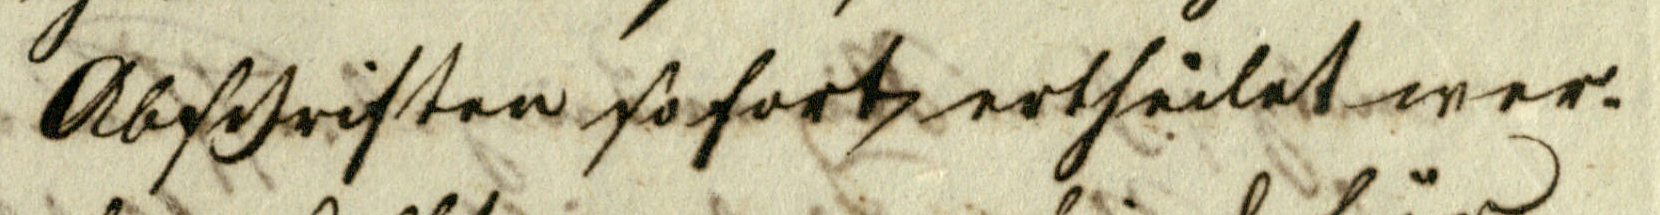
Abschriften sofort ertheilet wer¬
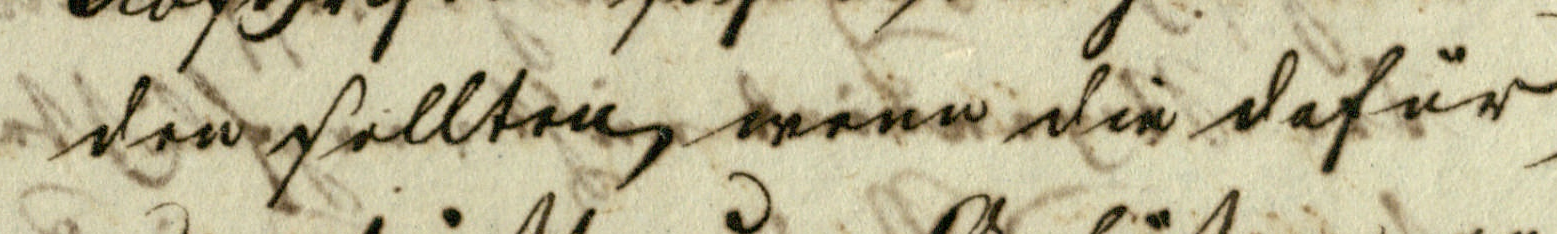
den sollten wenn die dafür
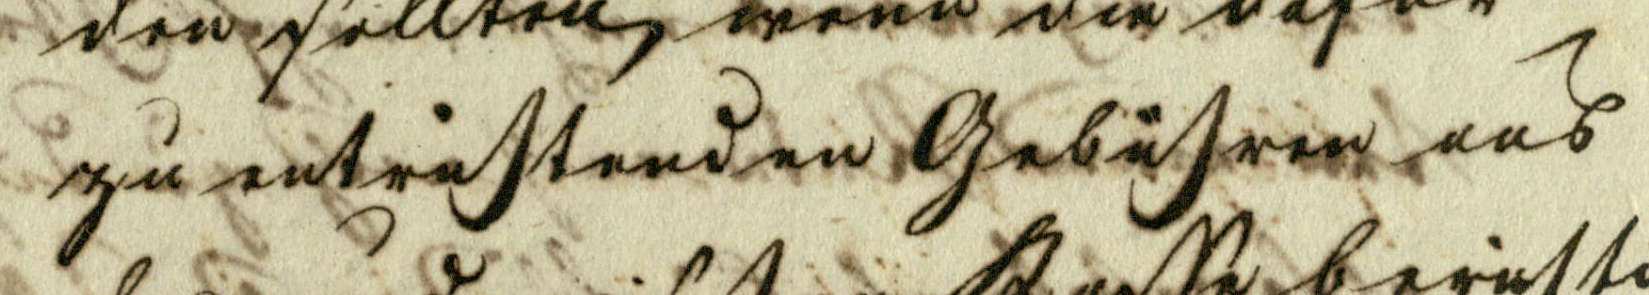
zu entrichtenden Gebühren aus
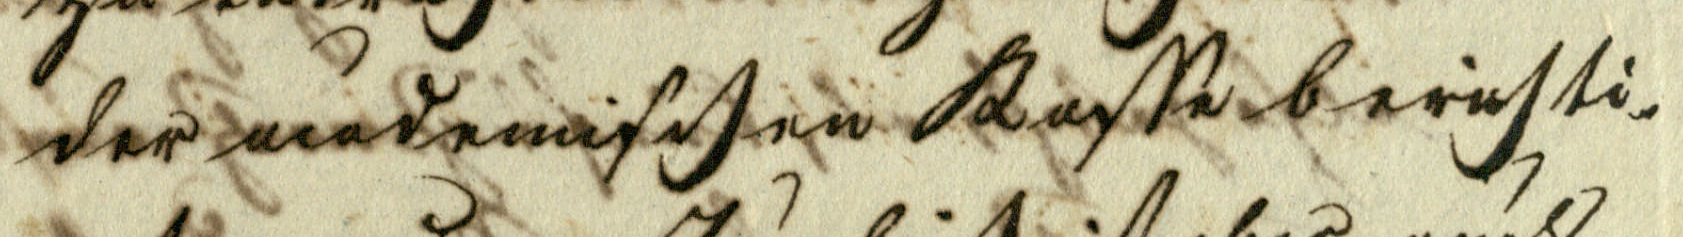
der academischen Kasse berichti¬
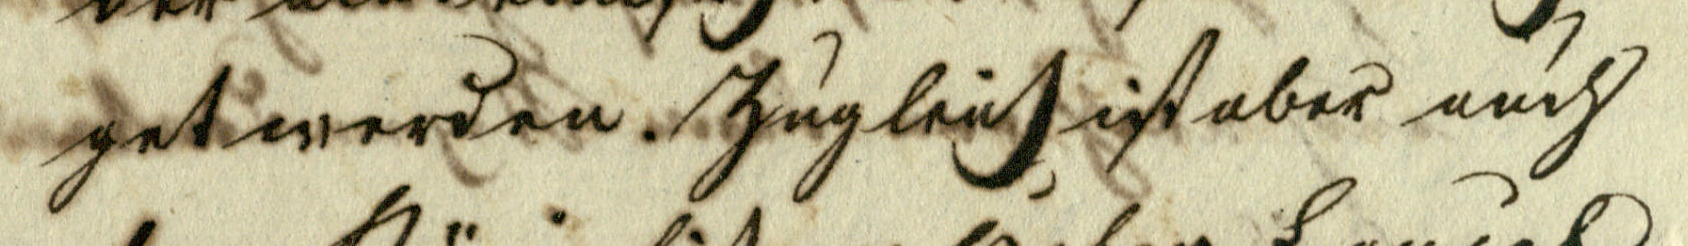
get werden. Zugleich ist aber auch
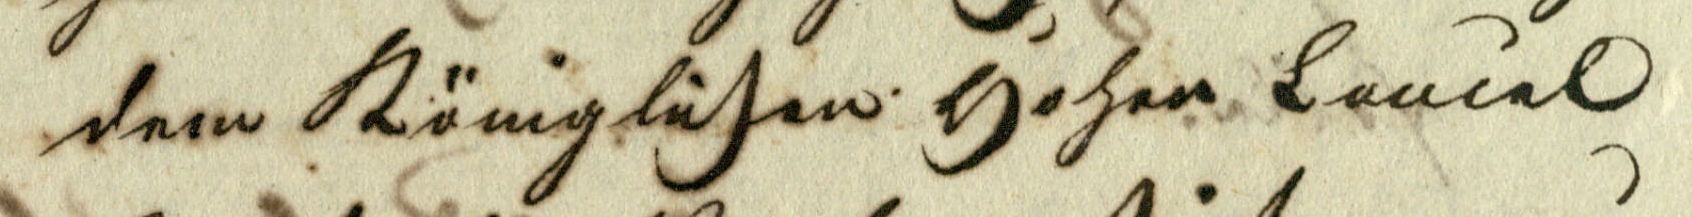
dem Königlichen Hohen Cancel¬
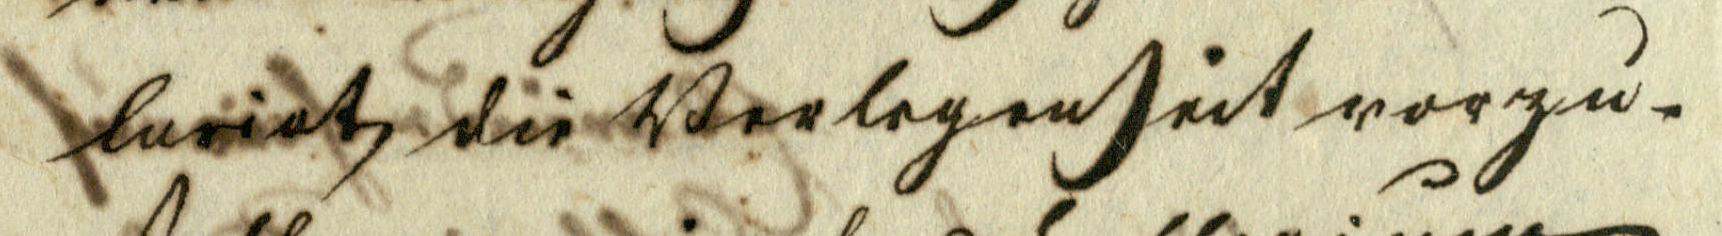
lariat die Verlegenheit vorzu¬
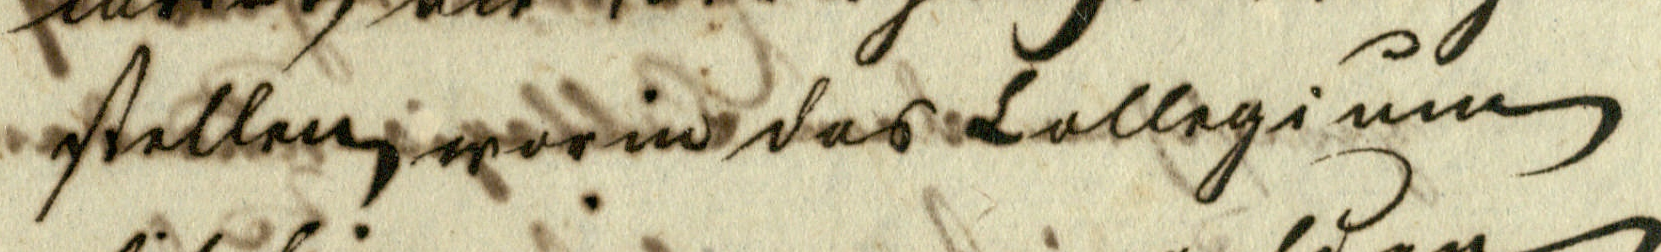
stellen worin das Collegium
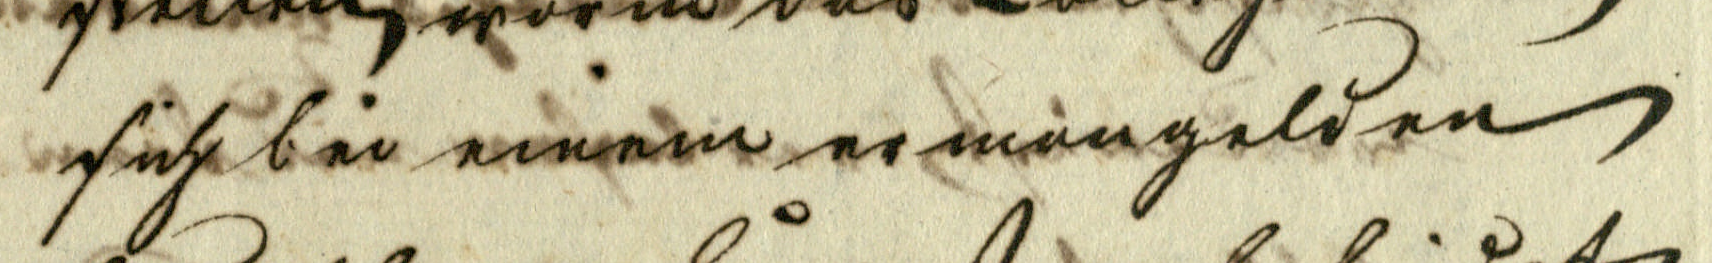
sich bei einen ermangelden
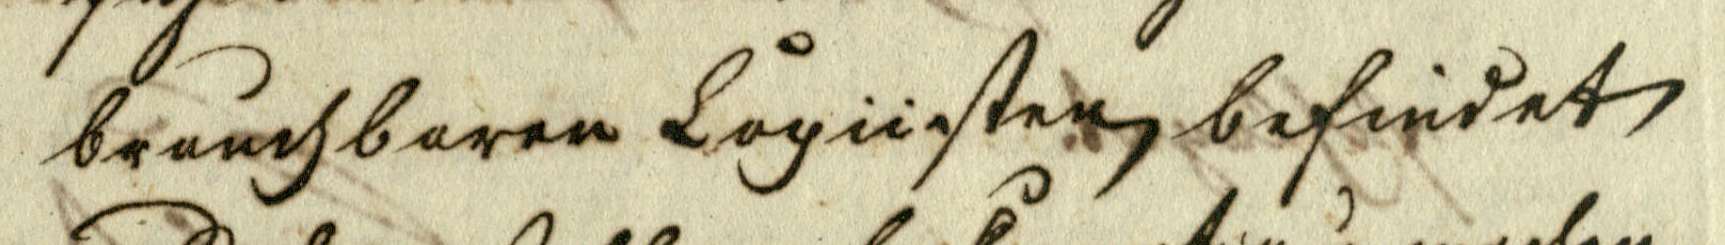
brauchbaren Copiisters befindet
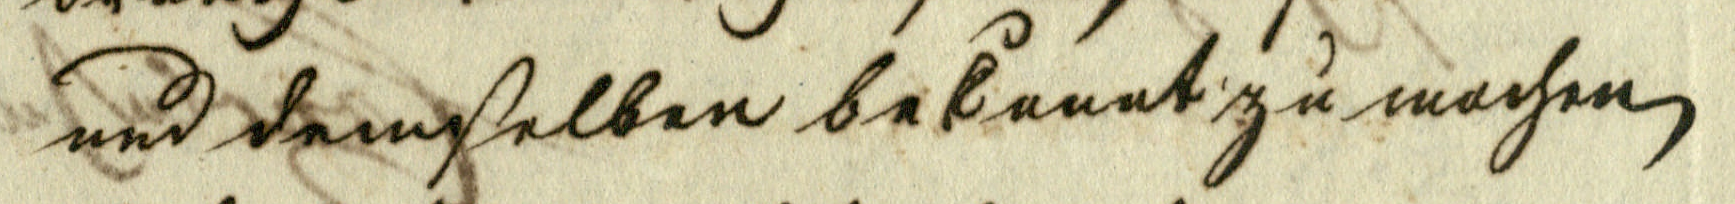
und demselben bekannt zumachen
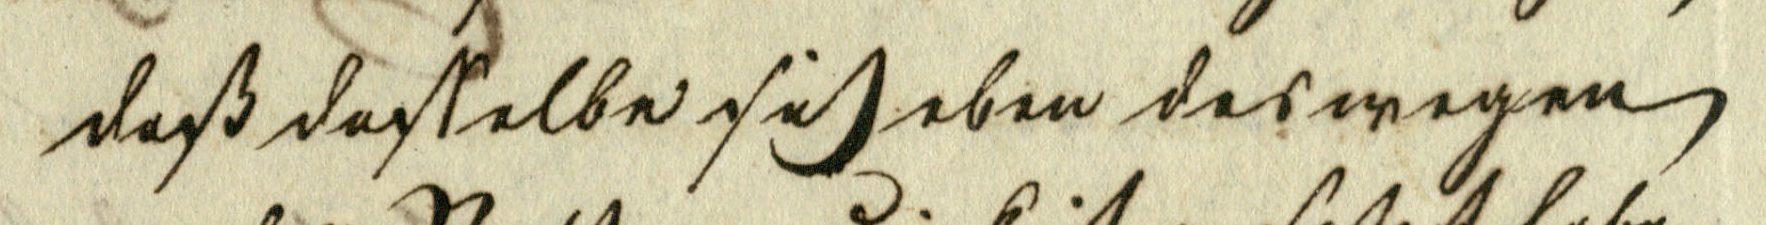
daß dasselbe sich eben des wegen
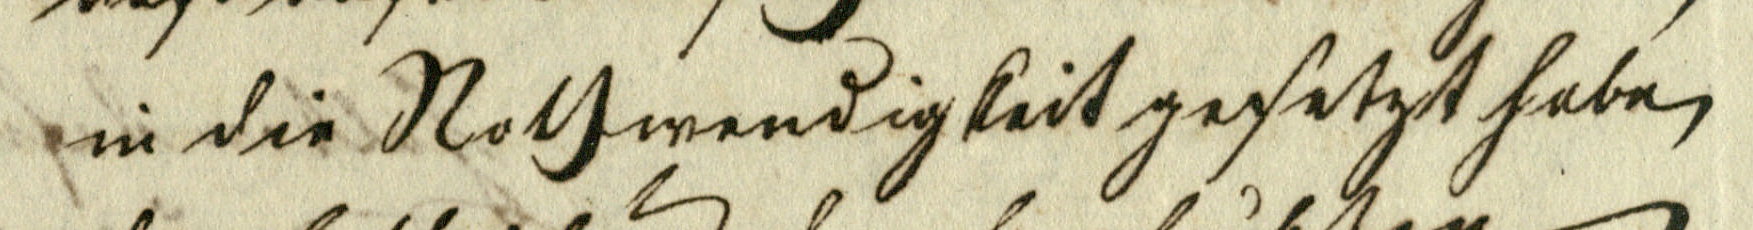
in die Nothwendigkeit gesetzt habe,
